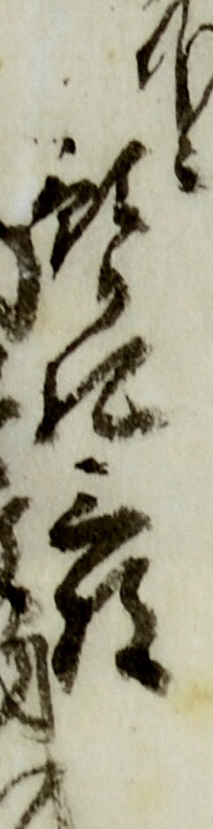預り札三枚
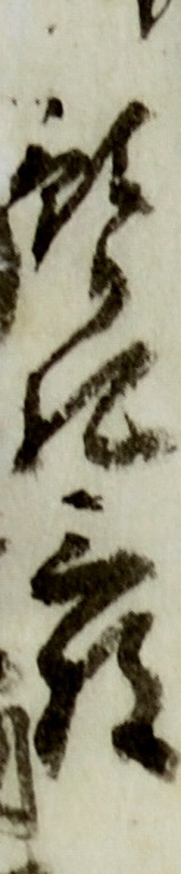預り札三枚

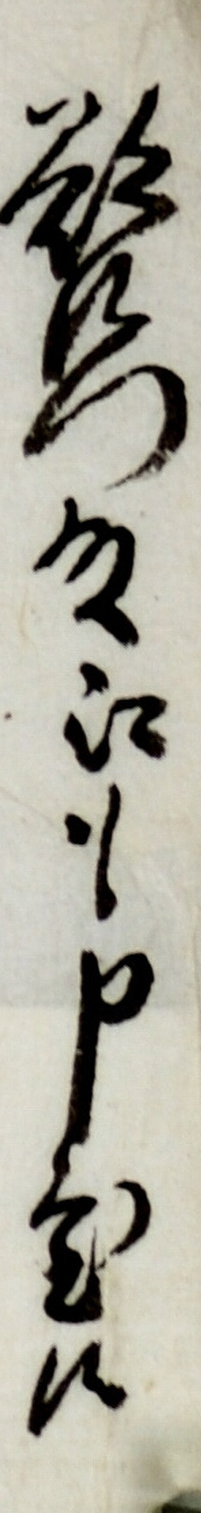郡左衛門殿えも申置候
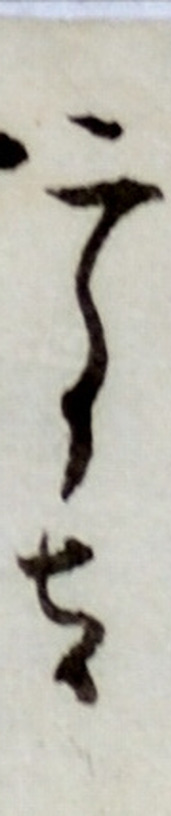二月七日
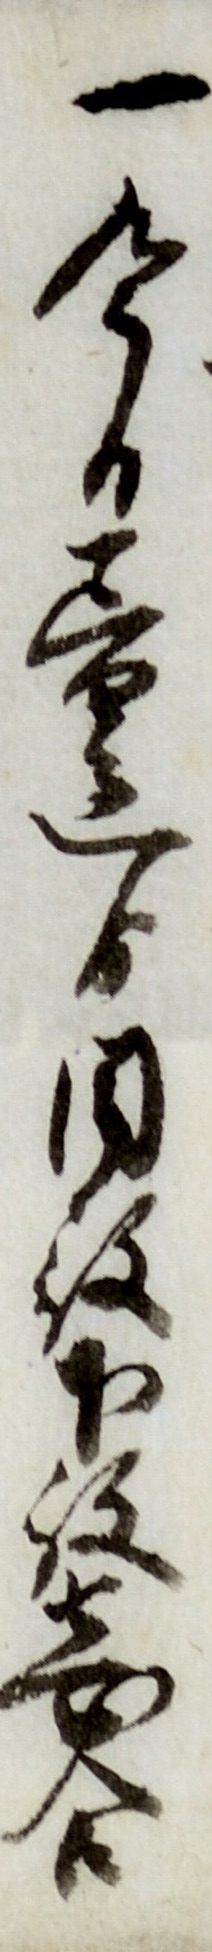一今日昼過より同役下役寄合
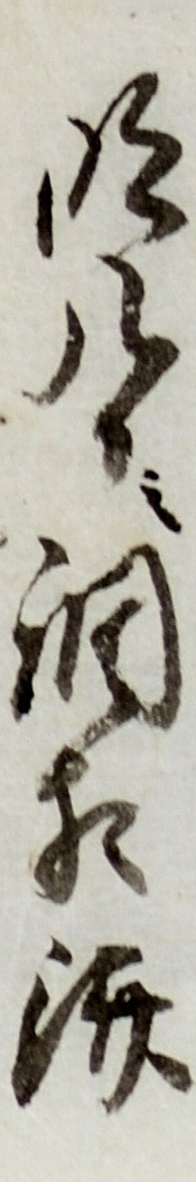明八日之調相済
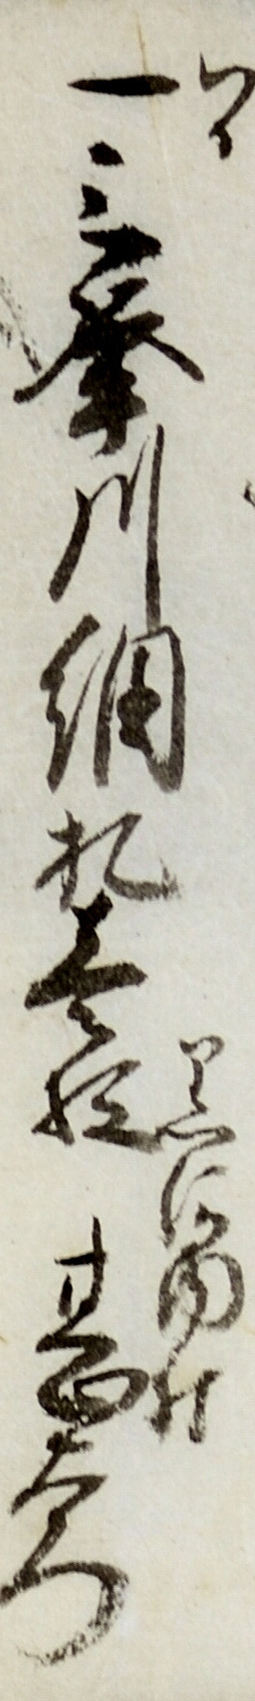一三峯川網札壱枚甚右衛門
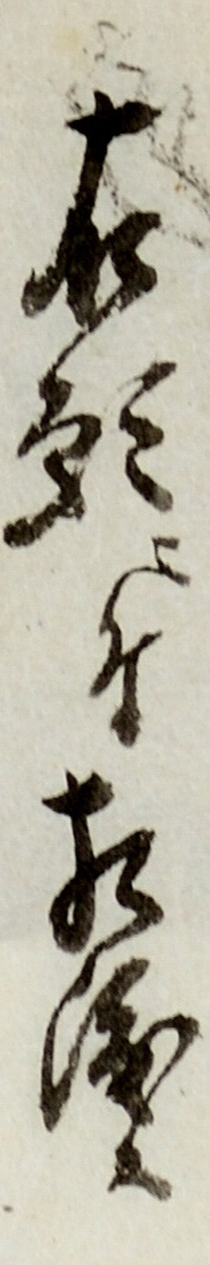右願に付相渡す
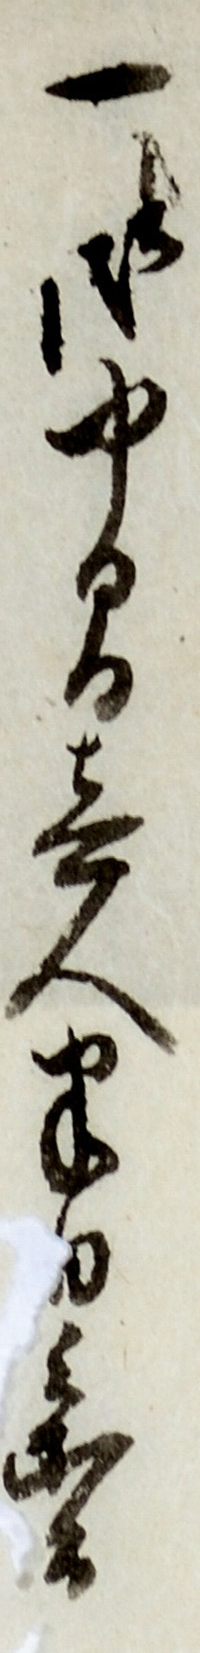一御中間壱人半日参候
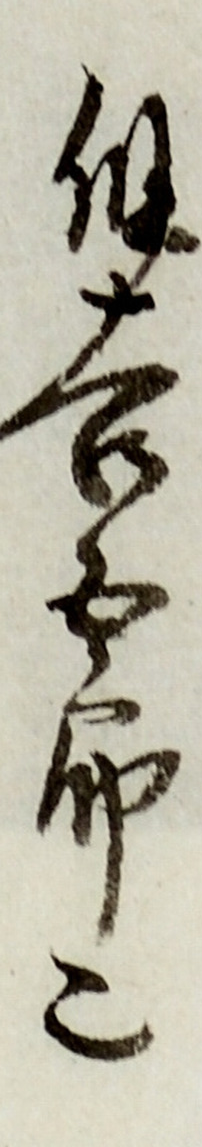但吉五郎也
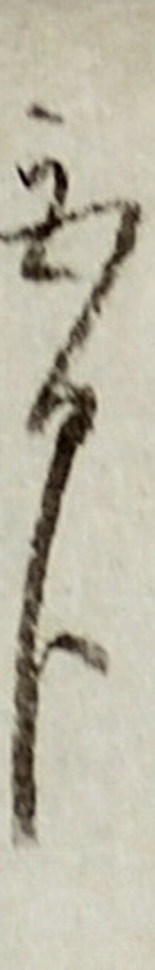五日分
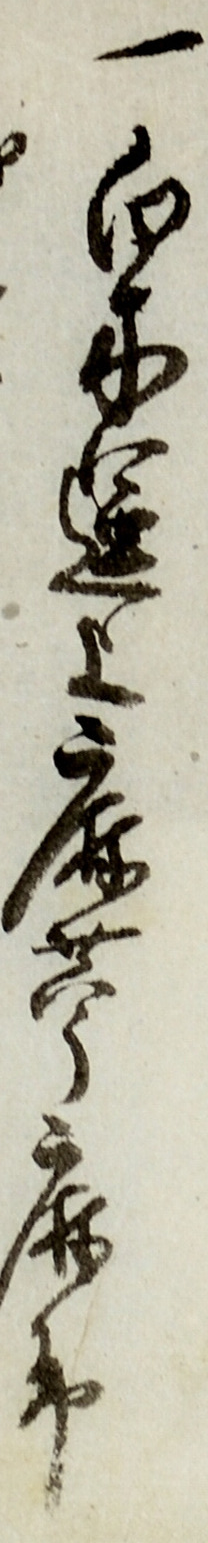一白木運上麻苧麻布
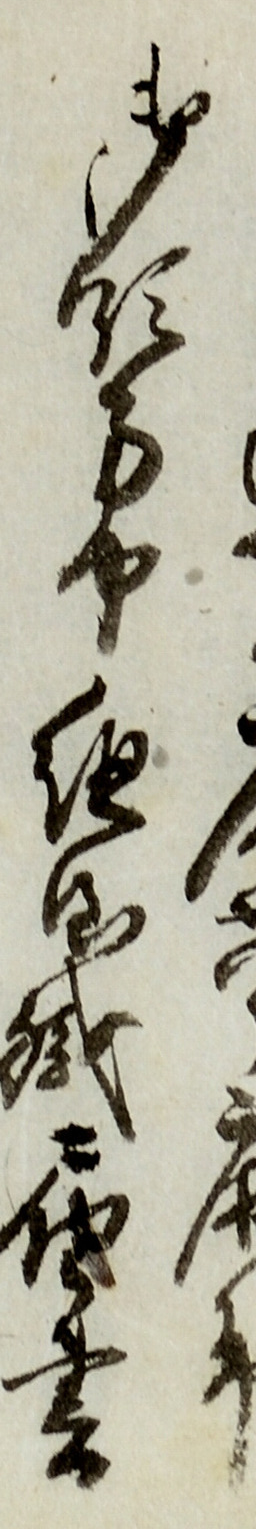御領分中組屋職届書
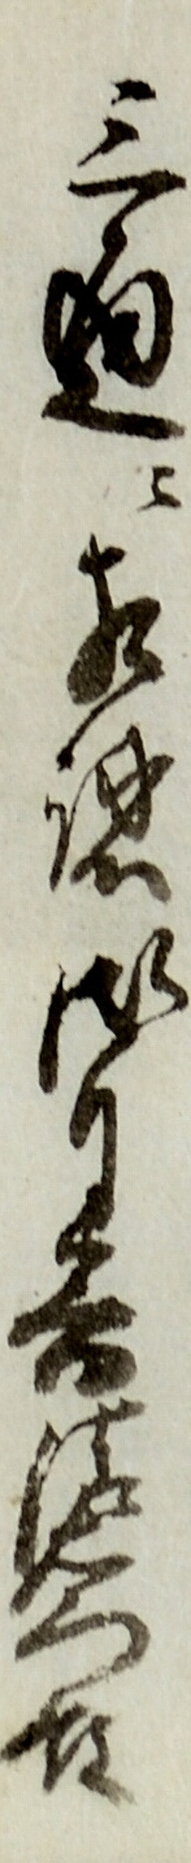三通に相認御月番清右衛門殿
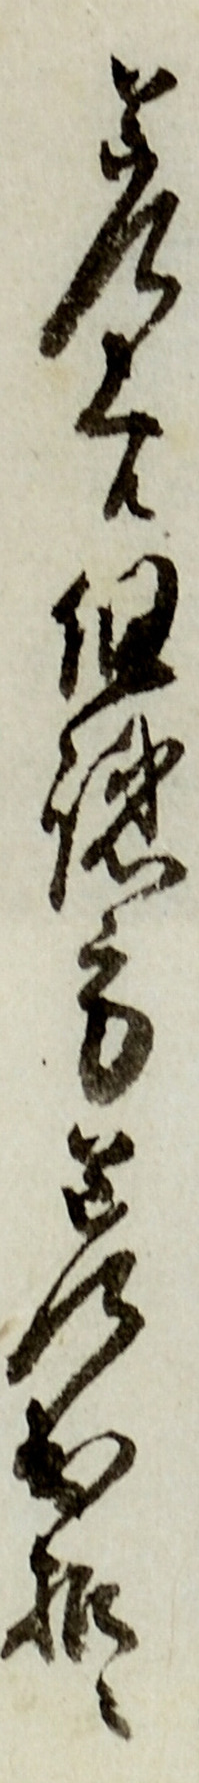差上る但認方差出扣に
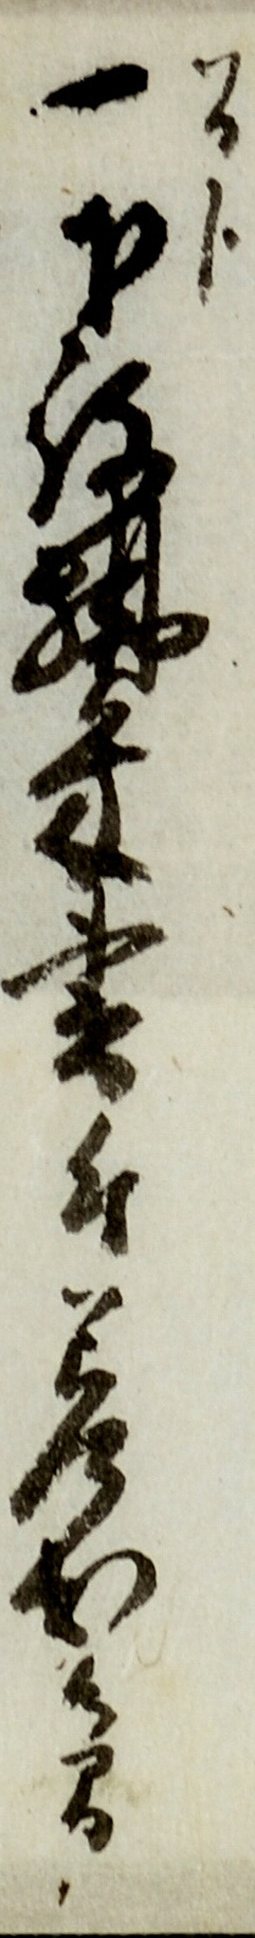一下役払米書付差出候間
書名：諸事御用留帳
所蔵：伊那市立高遠町図書館・合同会社AMANE
